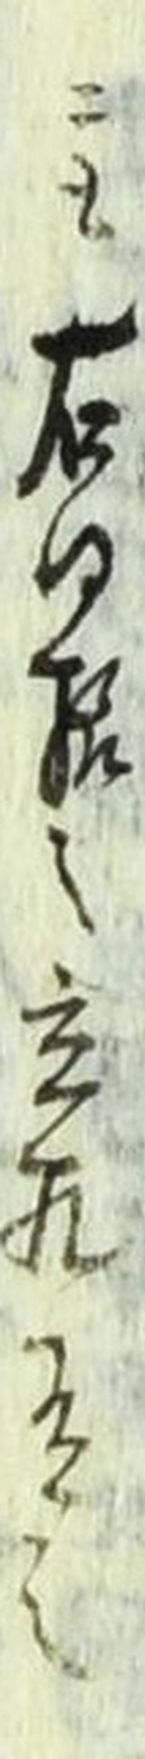にも右同様之立札有之
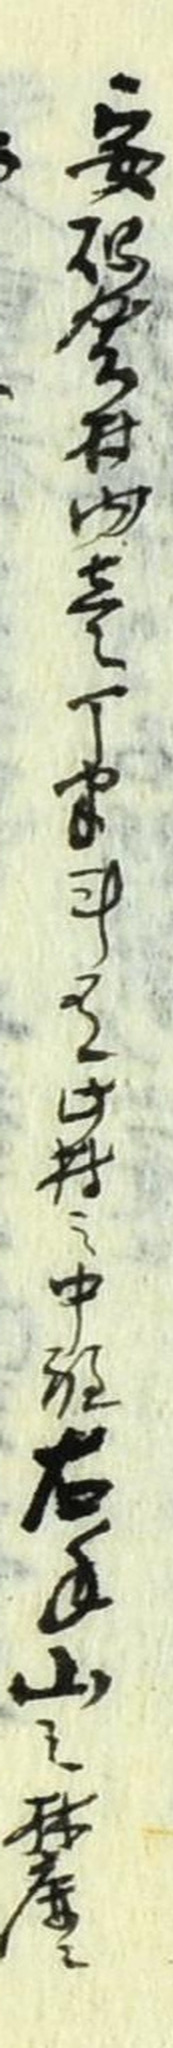安破賀村内壱丁半計有此村之中程右手山之麓に
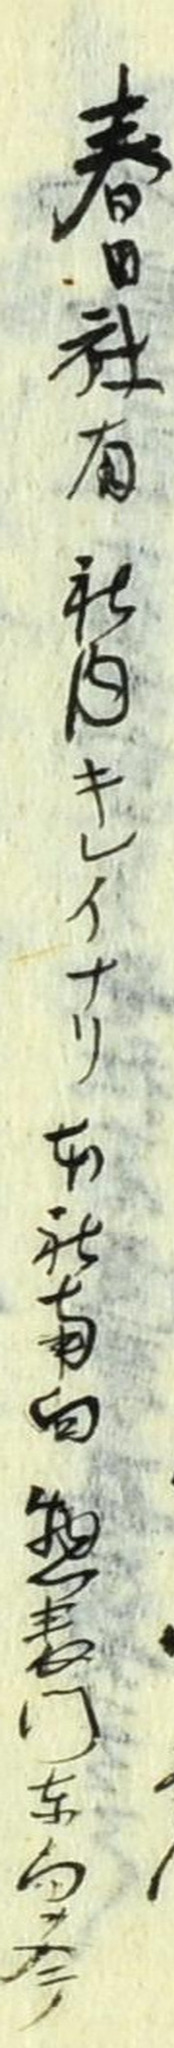春日社有社内キレイナリ本社南向惣表門東向ヲ入テ
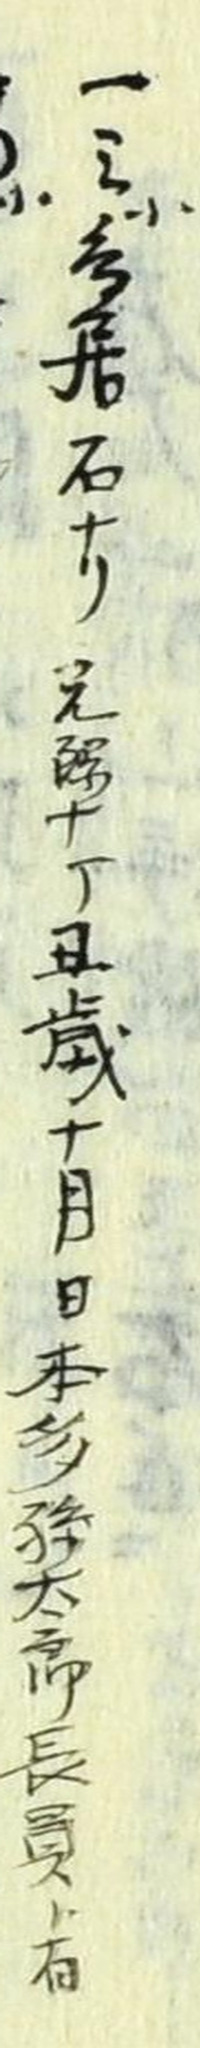一之小鳥居石ナリ元禄十丁丑歳十月日本多孫太郎長員ト有
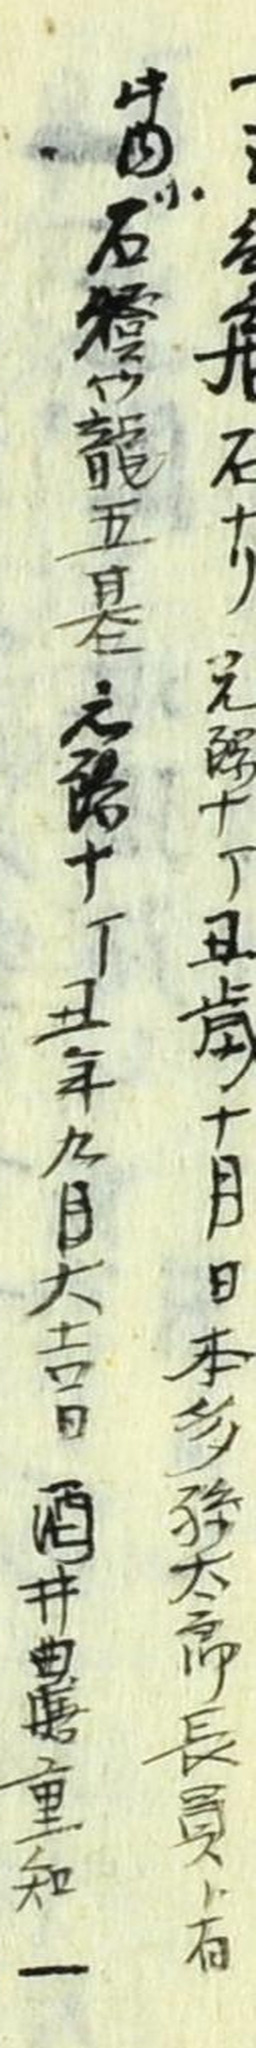此内小石灯籠五基元禄十丁丑年九月大吉日酒井曲膳重知一
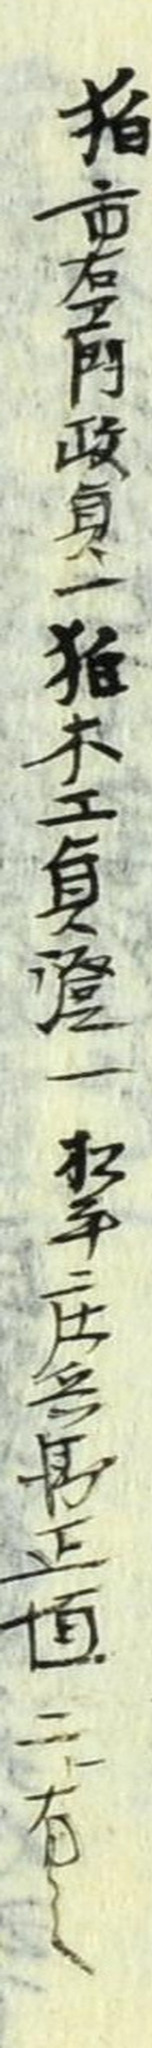狛市右ヱ門政貞一狛木エ貞澄一松平庄兵衛正恒二ト有之
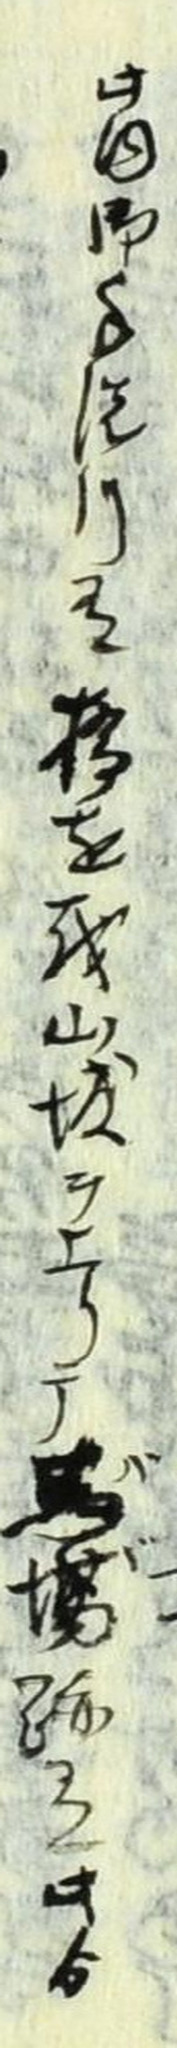此内御手洗川有橋を越山坂を上りテ馬場跡有此ゟ
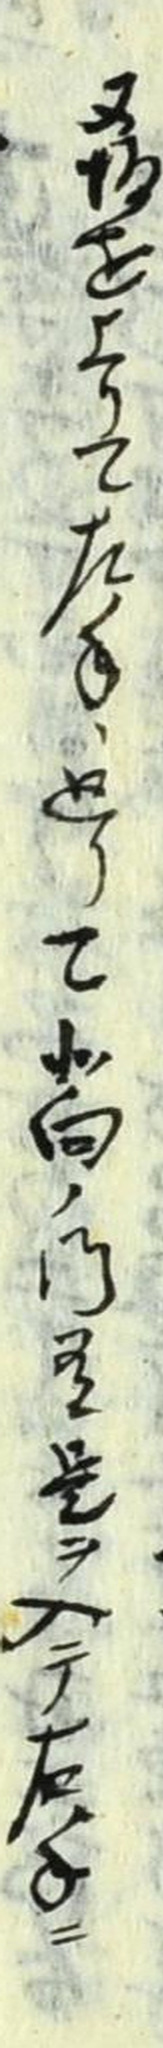又坂を上りて左手へ廻りて北向の門有是ヲ入テ右手ニ
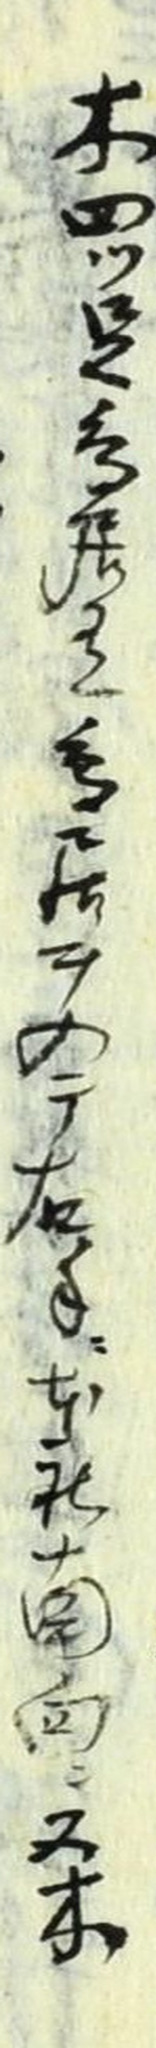木四ツ足鳥居有鳥居ヲ入テ右手ニ本社南向ニ又木
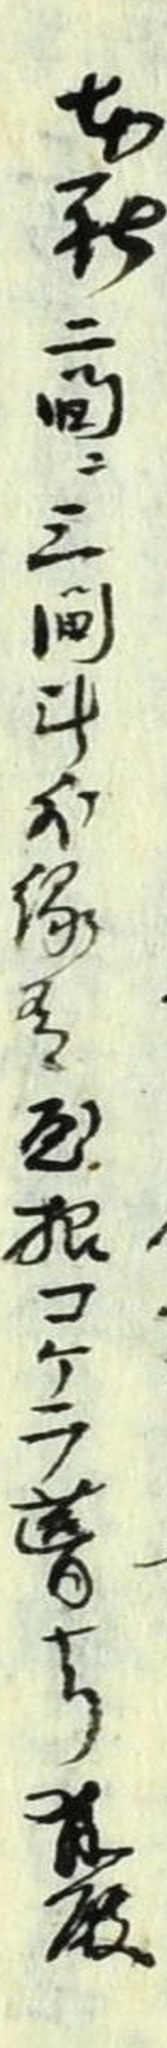本社二間ニ三間計外縁有屋根コケラ葺ナリ拝殿
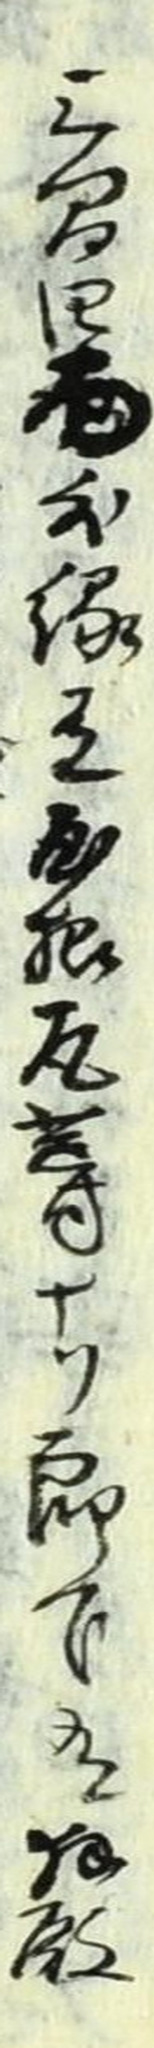三間四間外縁有屋根瓦葺ナリ廊下有拝殿
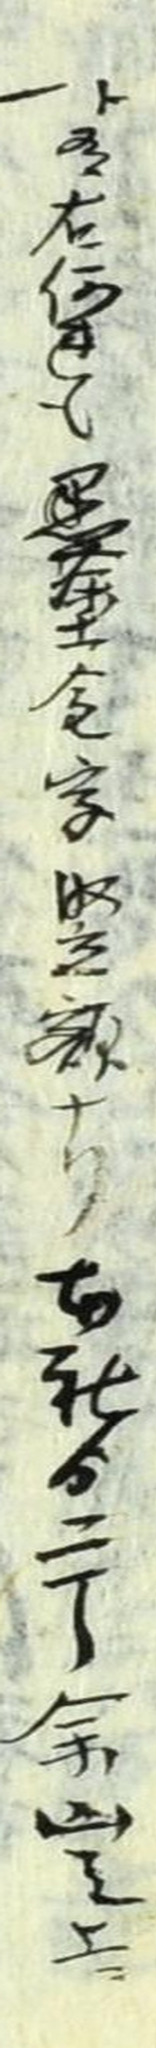ト一有右何れも黒塗金字堅額なり本社ゟ二丁余山之上に
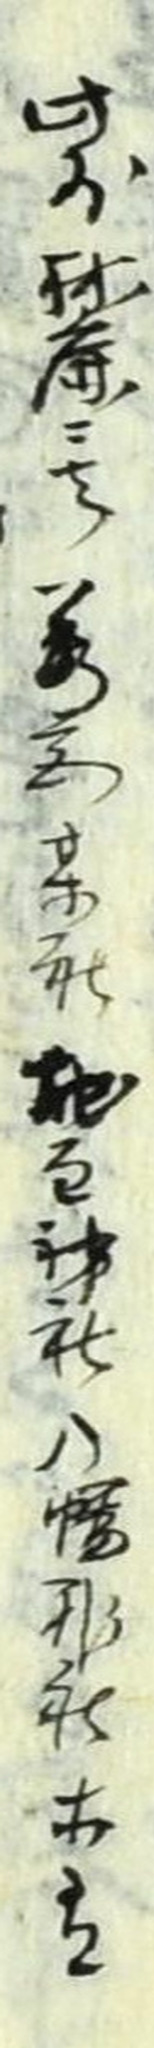此外麓ニ者若宮某社地主神社八幡神社等有
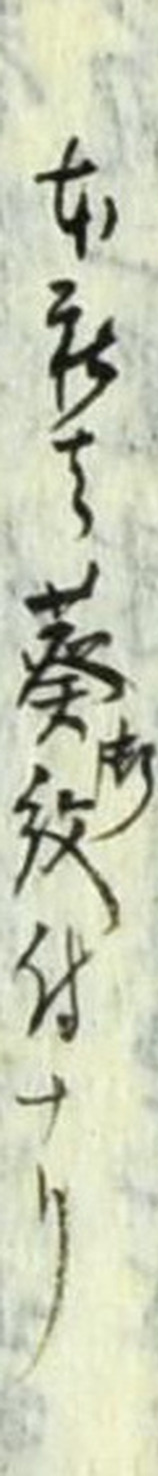本社者葵御紋付ナリ

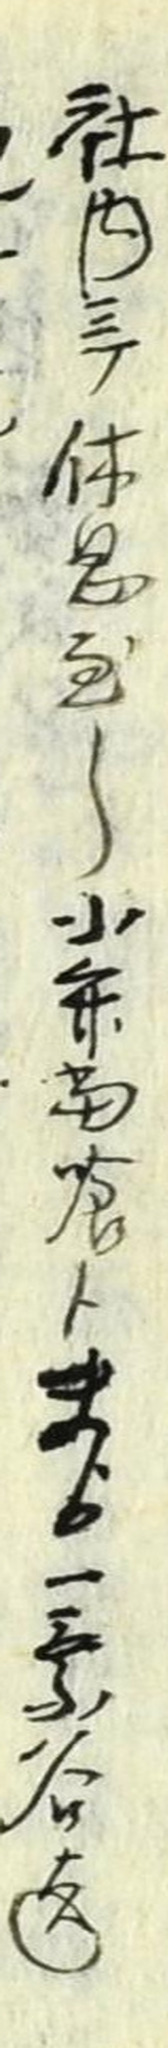社内ニテ休息致し小弁当喰候夫ゟ一乗谷迄
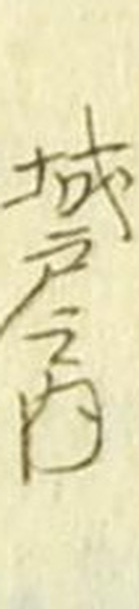城戸之内
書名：（日記）
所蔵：福井県文書館 Fukui Prefectural Archives
